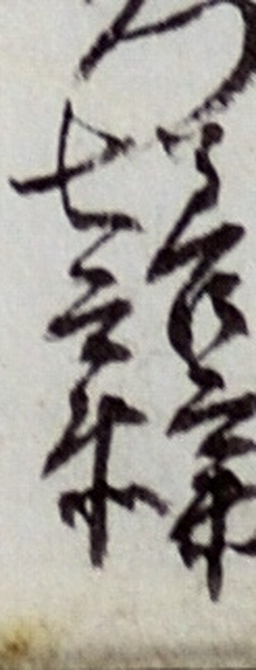七兵衛
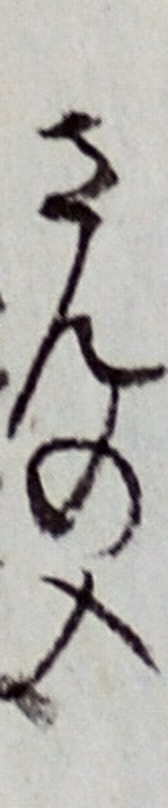さんの入
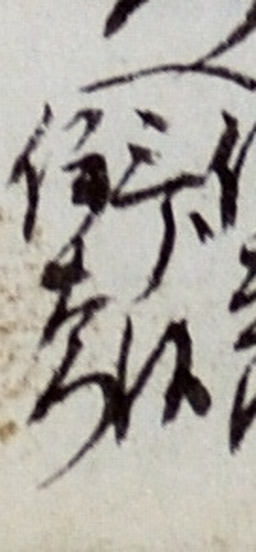伊右衛門
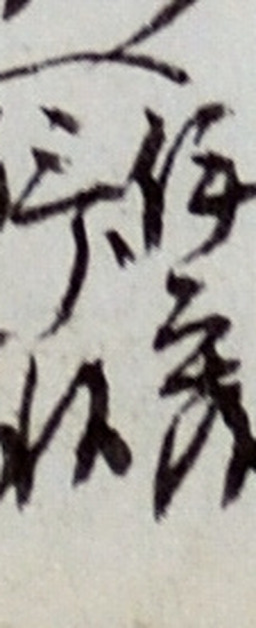三郎治
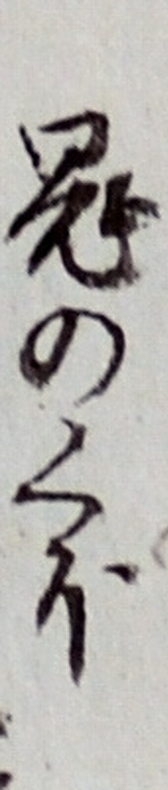鬼のくほ
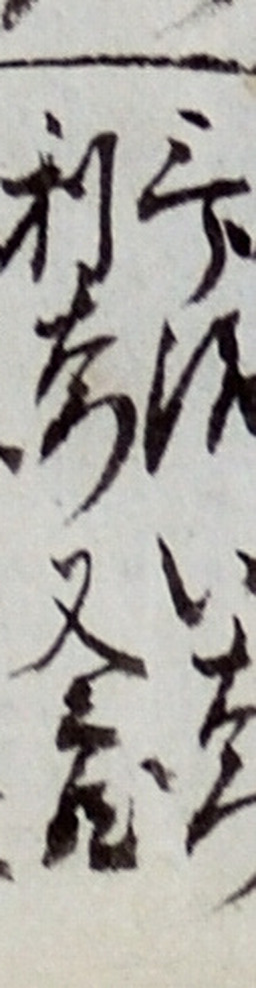利右衛門又蔵
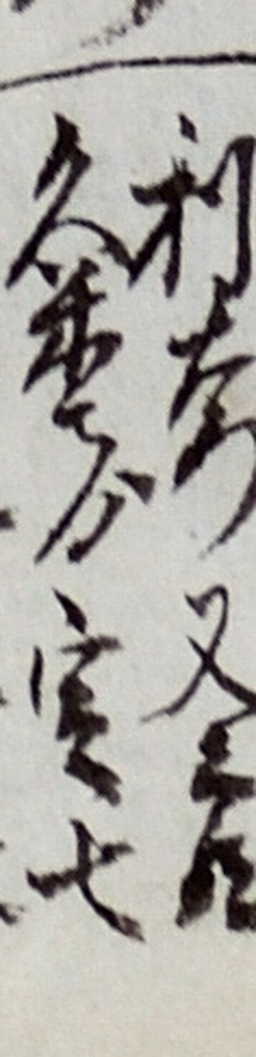久米七郎定七
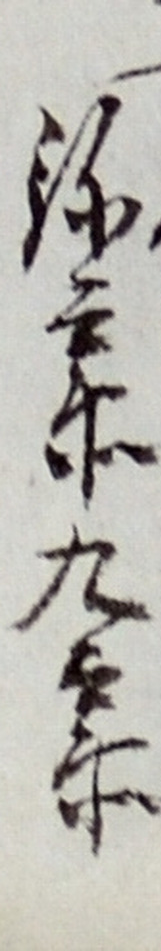弥兵衛九兵衛
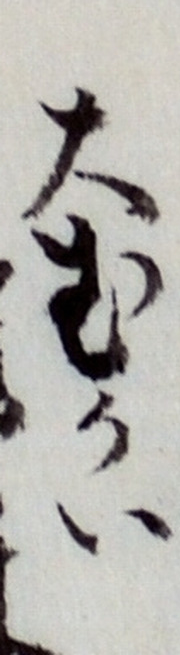大むかい
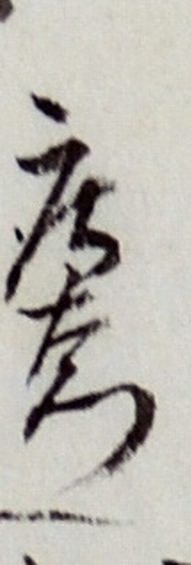伊右衛門
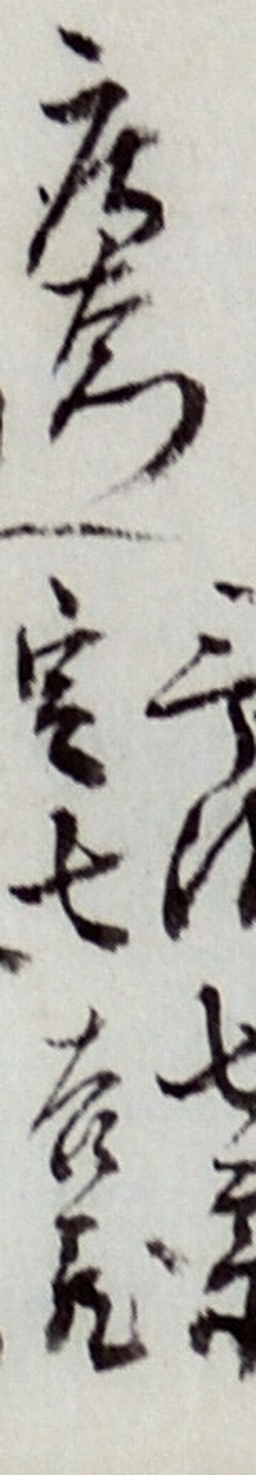理右衛門定七吉蔵
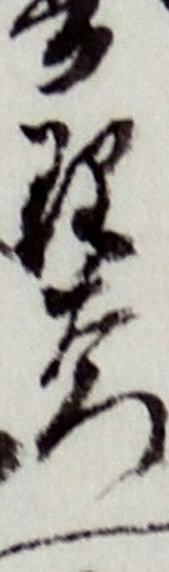伊右衛門
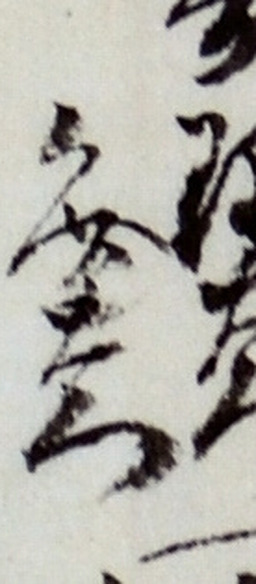伊右衛門
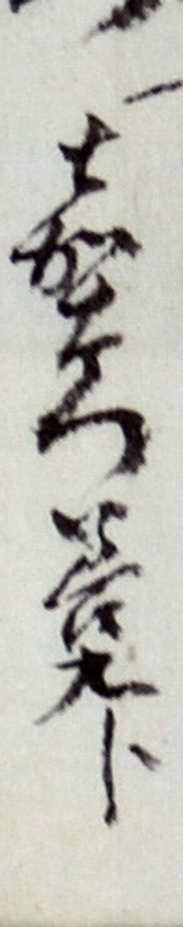嘉右衛門善九郎
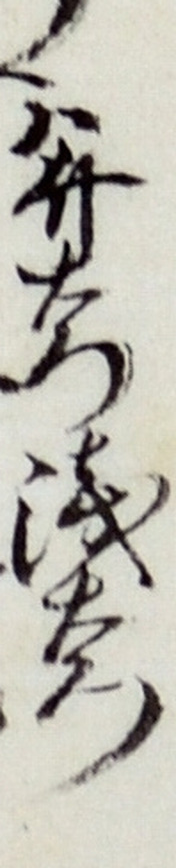文右衛門義右衛門
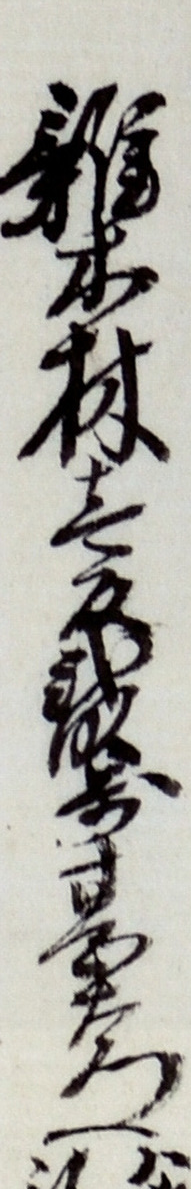雑木林壱反弐畝歩庄右衛門善兵衛
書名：御領分中山林社地手控
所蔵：伊那市立高遠町図書館・合同会社AMANE
